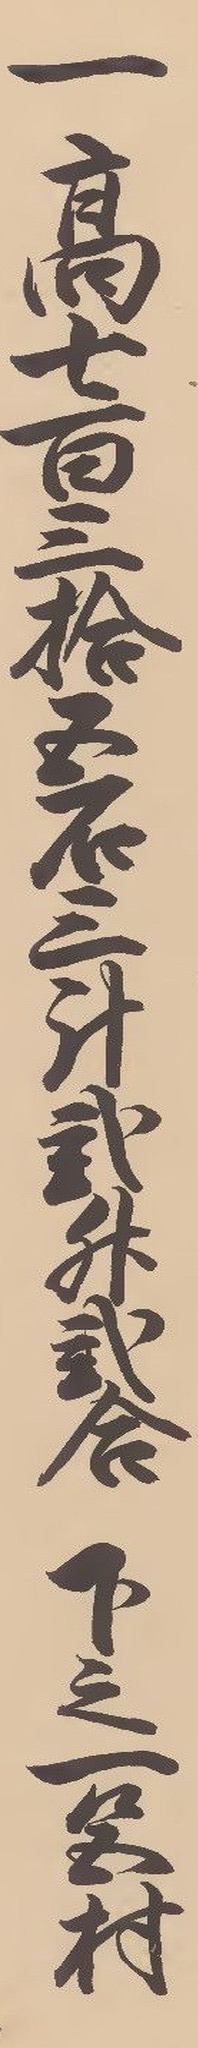一高七百三拾五石三斗弐升弐合下之一色村
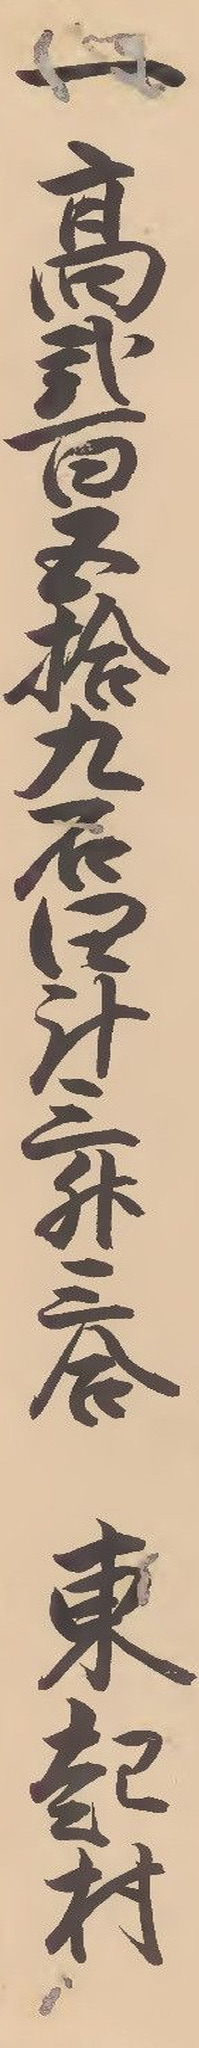一高弐百五拾九石四斗三升三合東起村

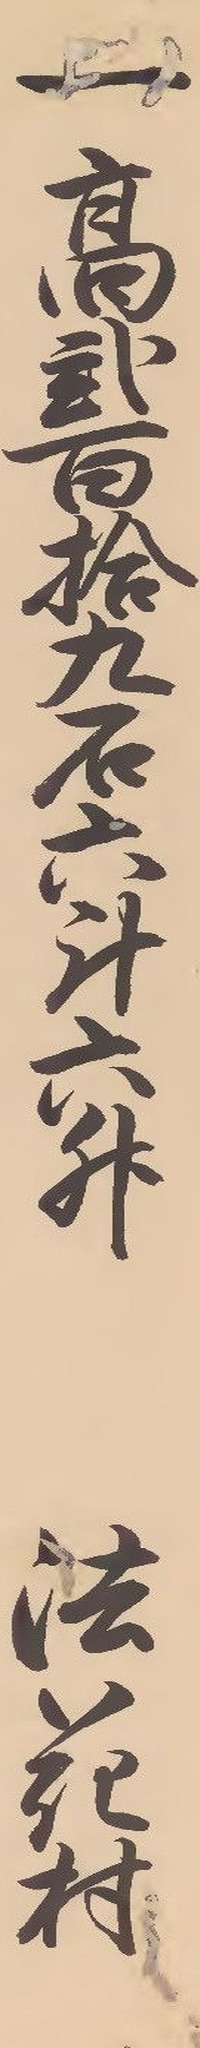一高弐百拾九石六斗六升法花村
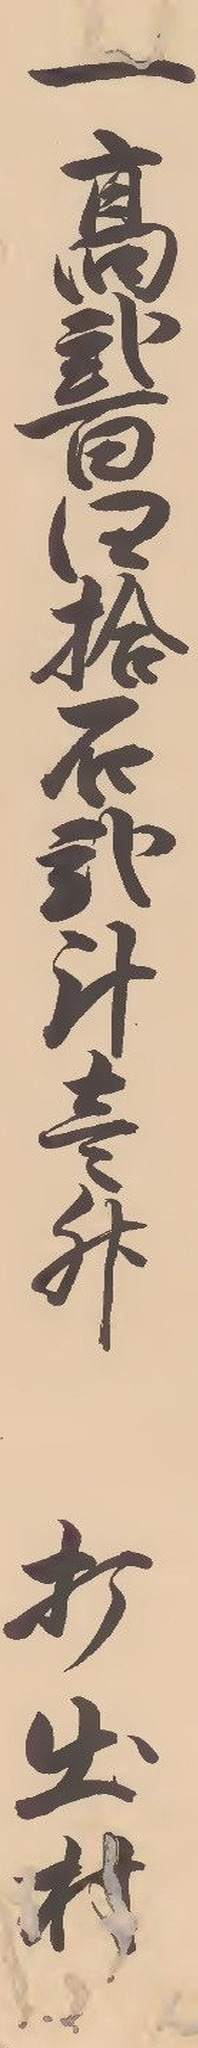一高弐百四拾石弐斗壱升打出村
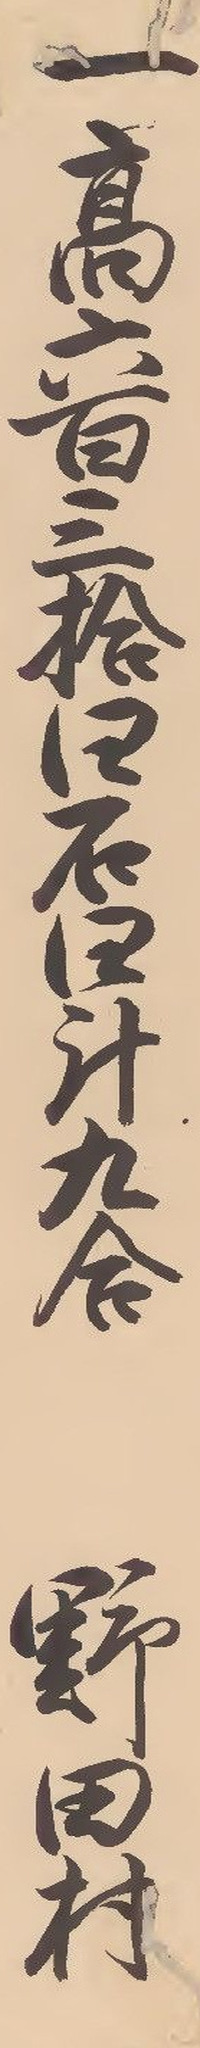一高六百三拾四石四斗九合野田村
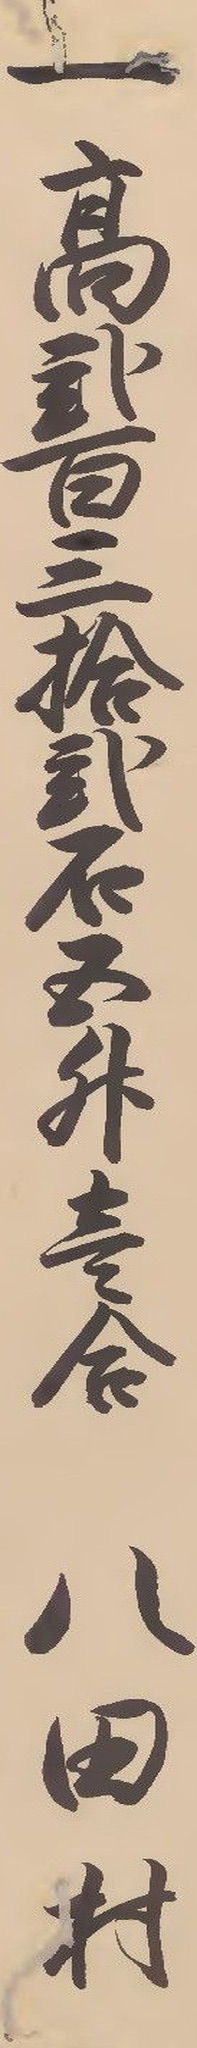一高弐百三拾弐石五升壱合八田村
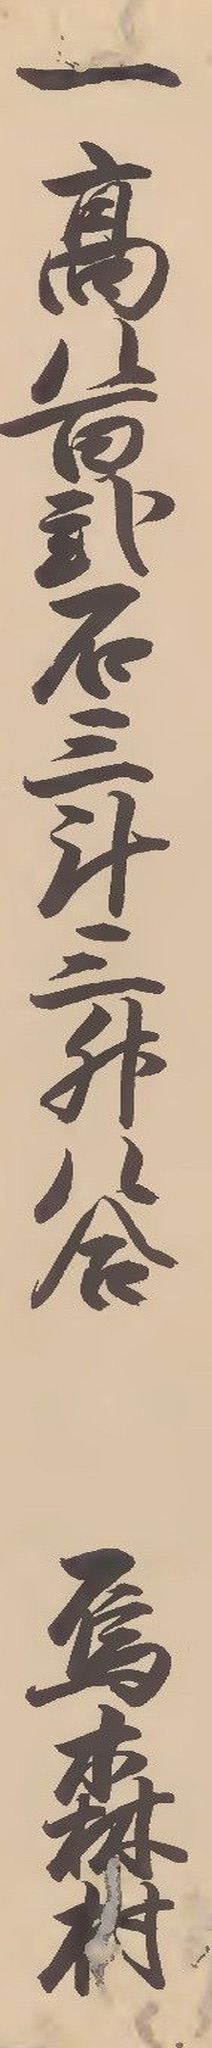一高八百弐石三斗三升八合烏森村
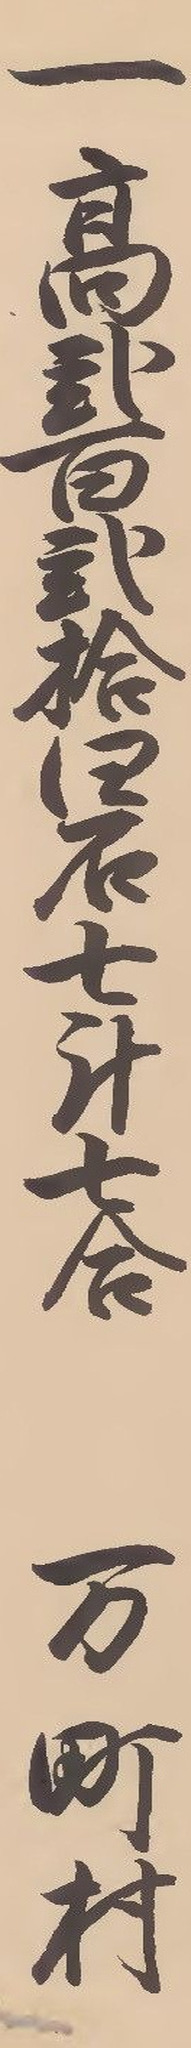一高弐百弐拾四石七斗七合万町村
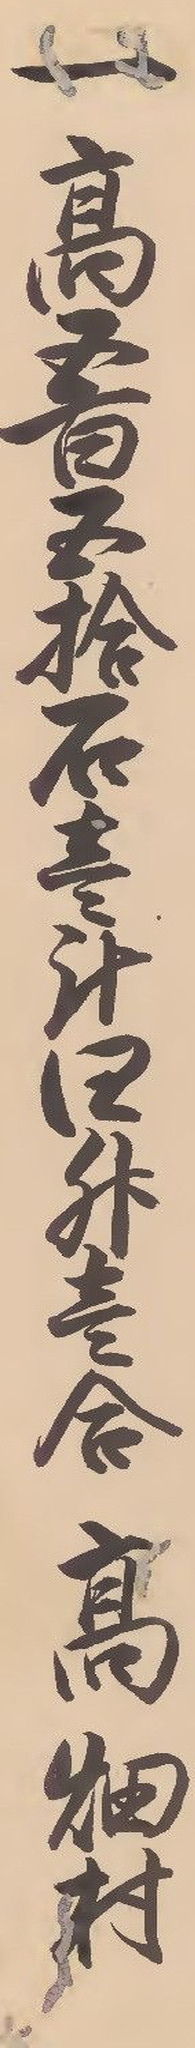一高五百五拾石壱斗四升壱合高畑村

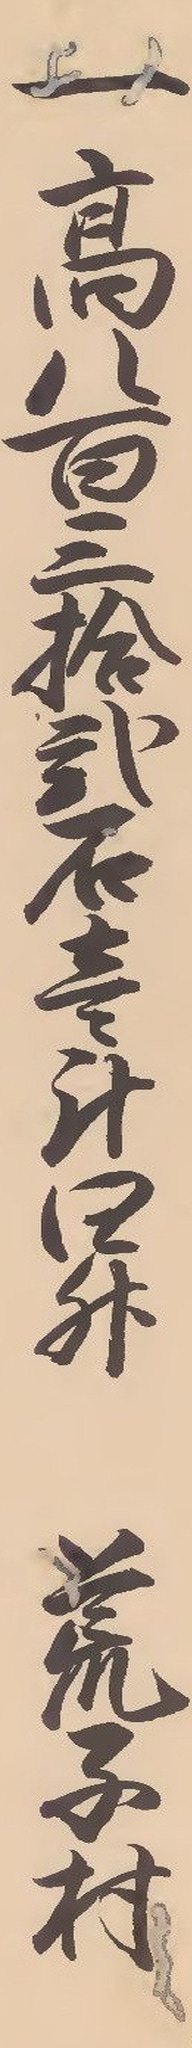一高八百三拾弐石壱斗四升荒子村
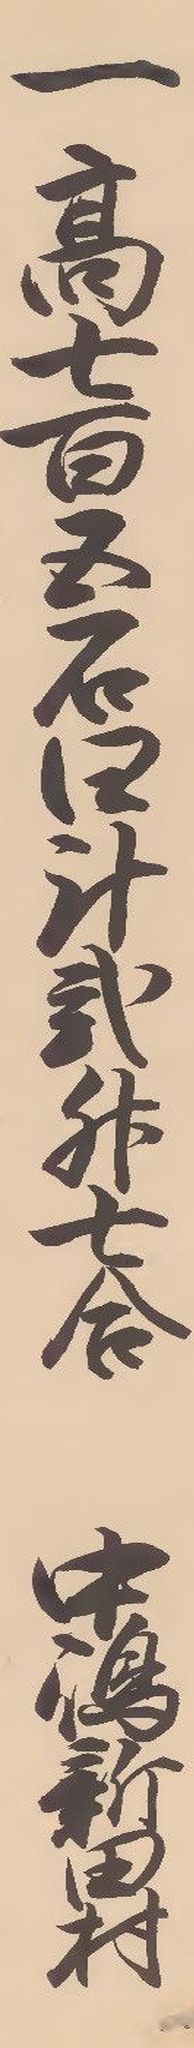一高七百五石四斗弐升七合中島新田村
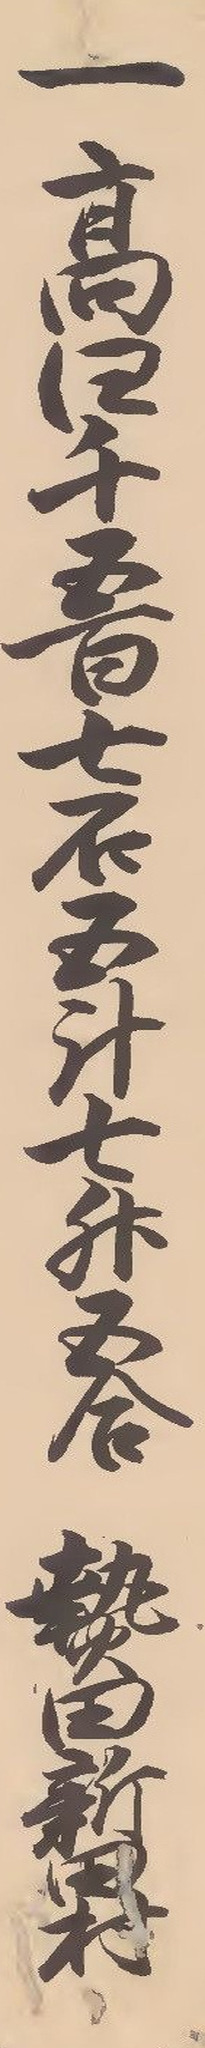一高四千五百七石五斗七升五合熱田新田村
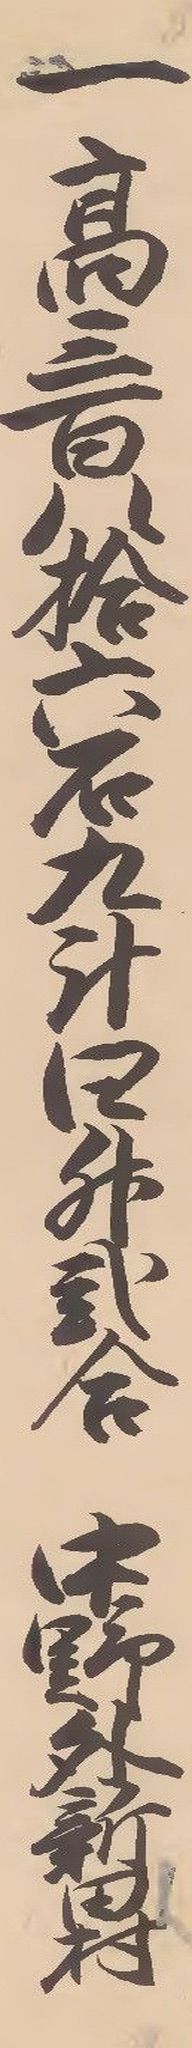一高三百八拾六石九斗四升弐合中野外新田村
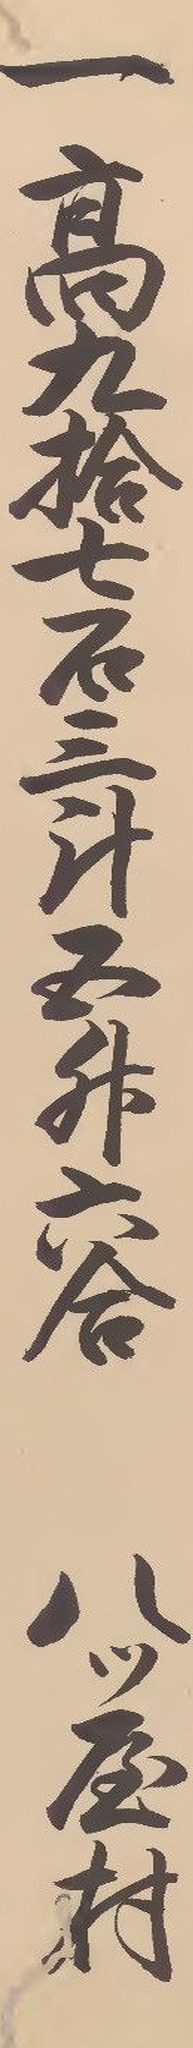一高九拾七石三斗五升六合八ツ屋村
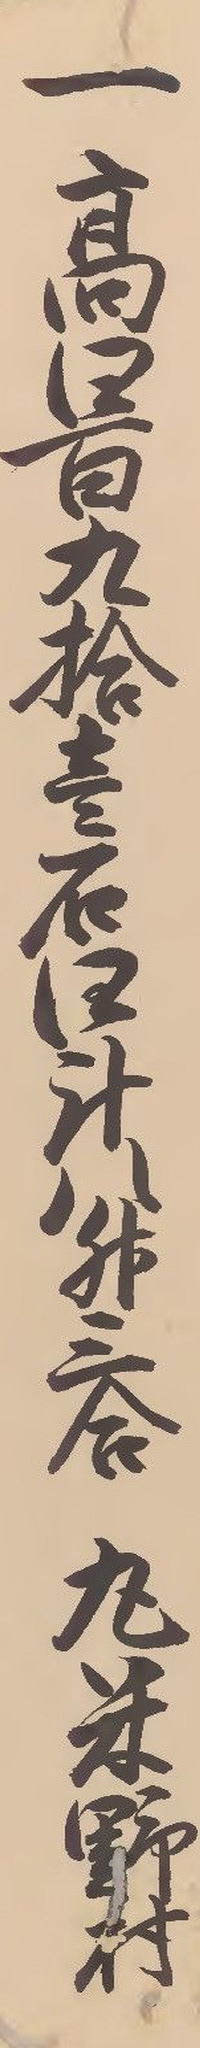一高四百九拾壱石四斗八升三合丸米野村
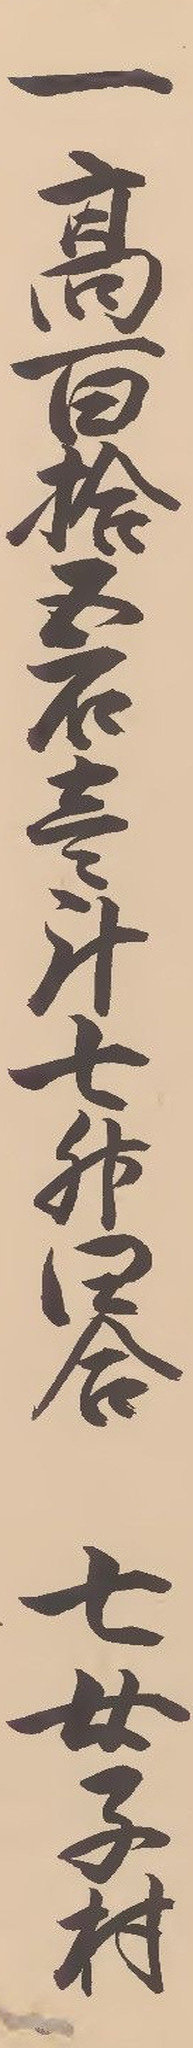一高百拾五石壱斗七升四合七女子村
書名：尾張国郷帳
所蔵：国立公文書館 National Archives of Japan
